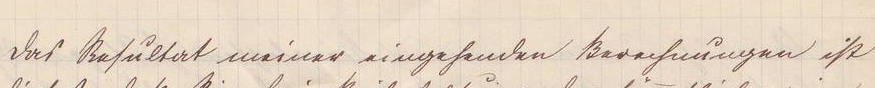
Das Resultat meiner eingehenden Berechnungen ist
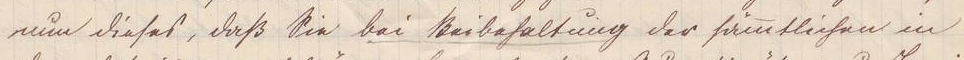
nun dieses, daß Sie bei Beibehaltung der sämmtlichen in
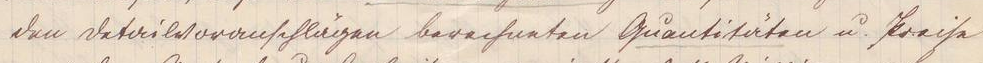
den Detailvoranschlägen berechneten Quantitäten u. Preise
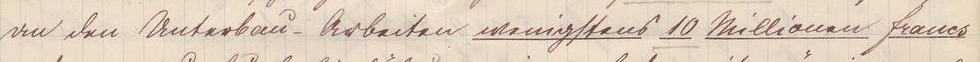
an den Unterbau-Arbeiten wenigstens10Millionenfrancs
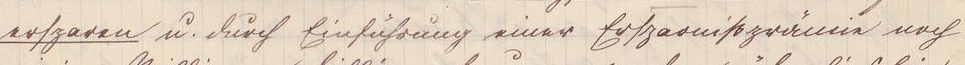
ersparen u. durch Einführung einer Ersparnißprämie noch
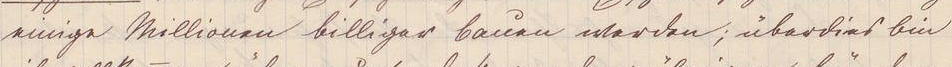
einige Millionen billiger bauen werden; überdies bin
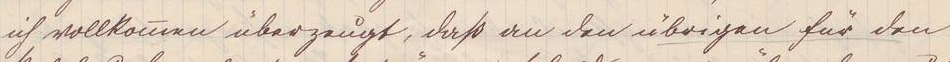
ich vollkommen überzeugt, daß an den übrigen für den
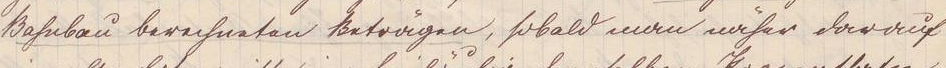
Bahnbau berechneten Beträgen, sobald man näher darauf
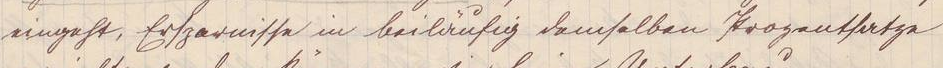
eingeht, Ersparnisse in beiläufig demselben Prozentsatze
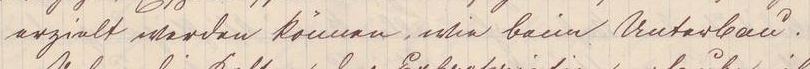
erzielt werden können, wie beim Unterbau.
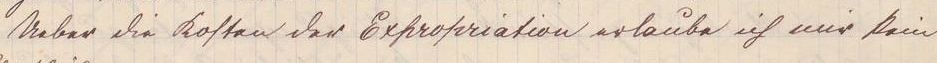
Ueber die Kosten der Expropriation erlaube ich mir kein
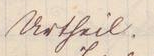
Urtheil.
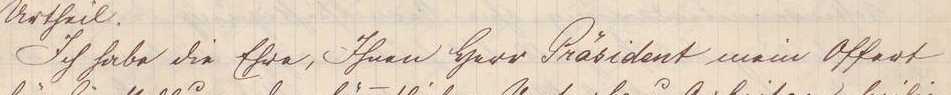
Ich habe die Ehre, Ihnen Herr Präsident mein Offert
